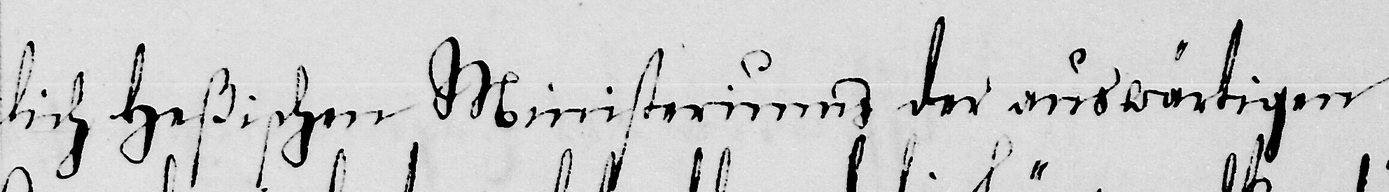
lich Heßischen Ministeriums der auswärtigen
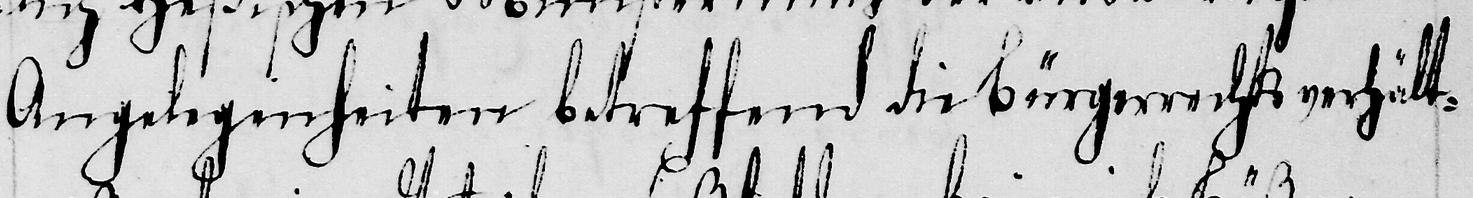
Angelegenheiten betreffend die Bürgerrechtsverhält¬
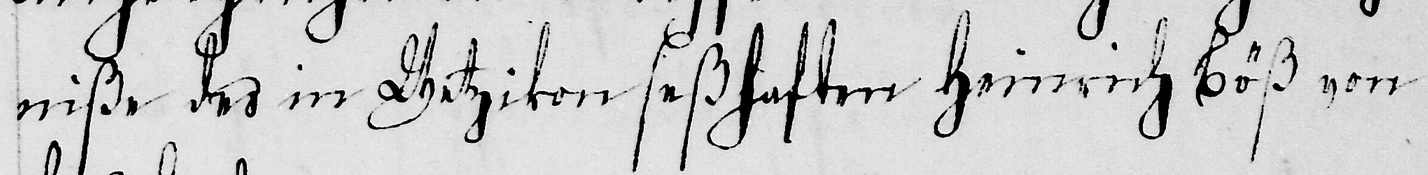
niße des in Wetzikon seßhaften Heinrich Böß von
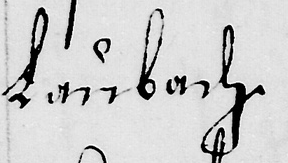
Laubach.
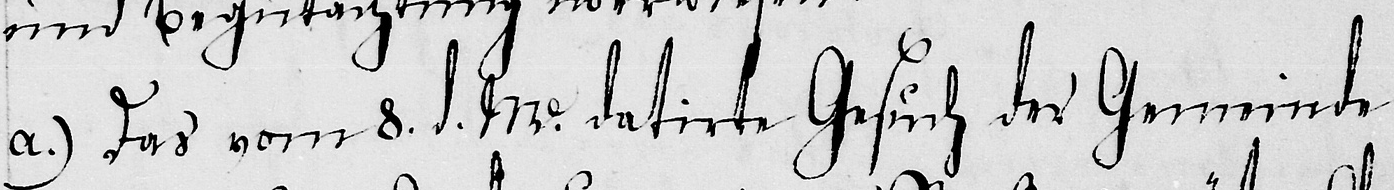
a.) Das vom 8. d. M. datirte Gesuch der Gemeinde
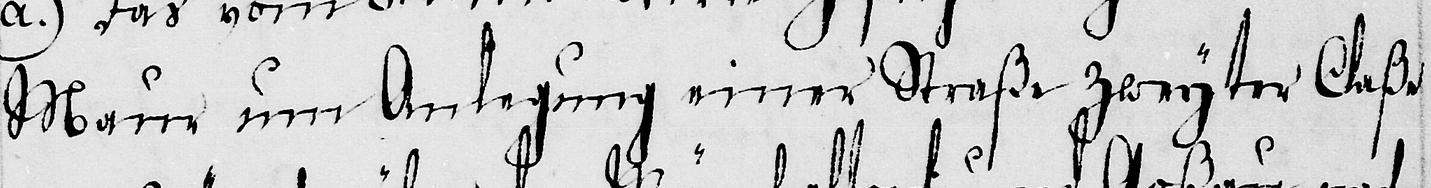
Maur um Anlegung einer Straße zweyter Claße
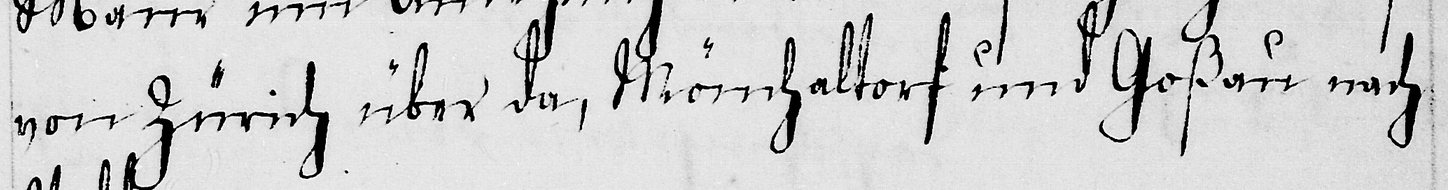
von Zürich über da, Mönchaltorf und Goßau nach
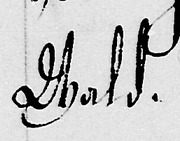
Wald.
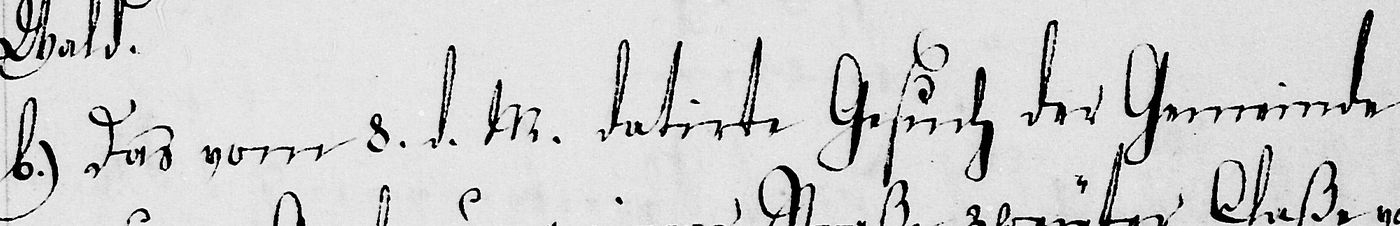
b.) Das vom 8. d. M. datirte Gesuch der Gemeinde
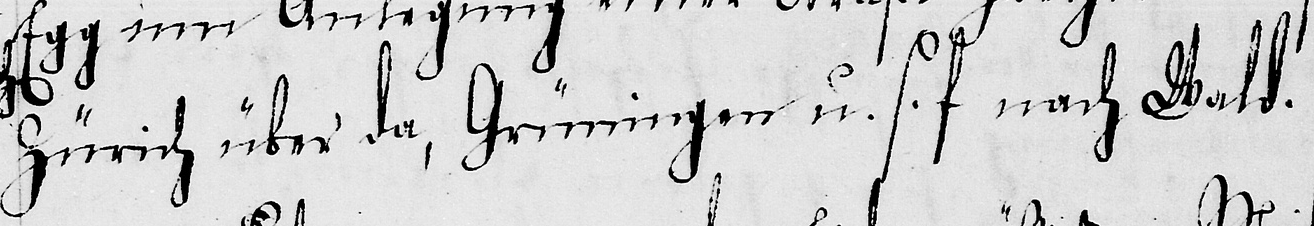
Zürich über da, Grüningen u.s.f. nach Wald.
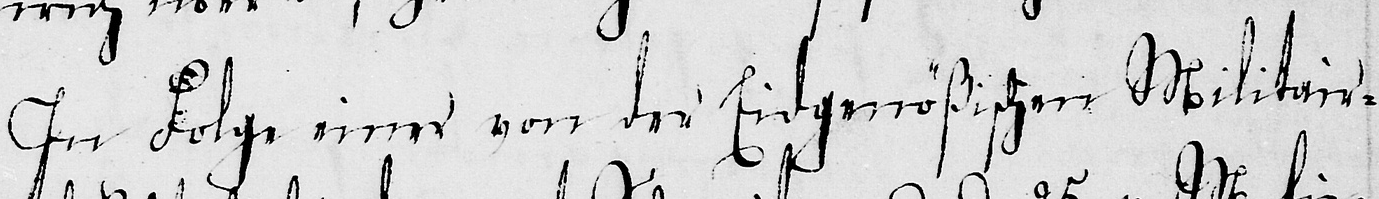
In Folge einer von der Eidgenößischen Militai¬
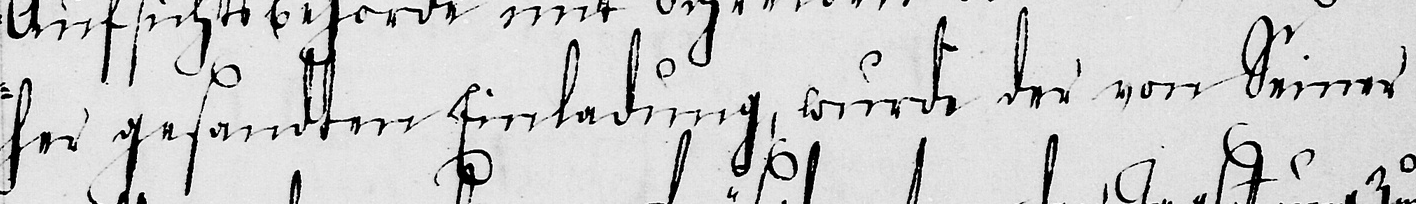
her gesandten Einladung, wurde der von Seiner
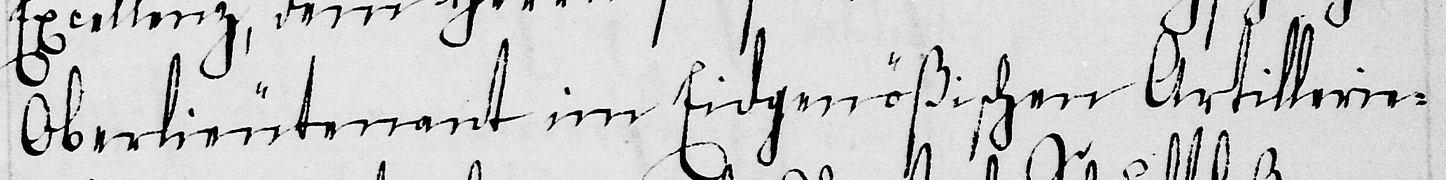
Oberlieutenant im Eidgenößischen Artillerie¬
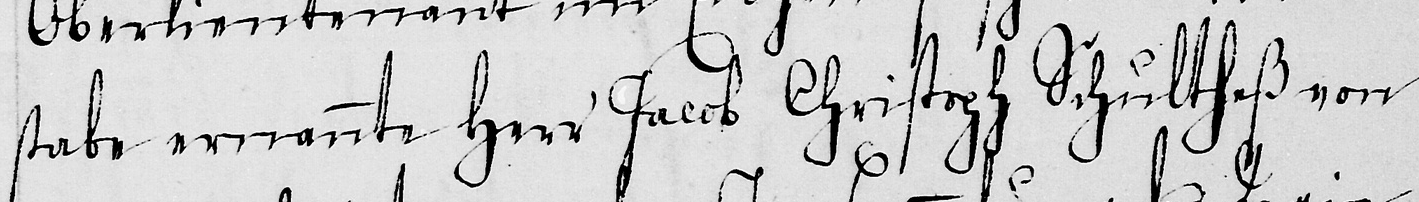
stabe ernannte Herr Jacob Christoph Schultheß von
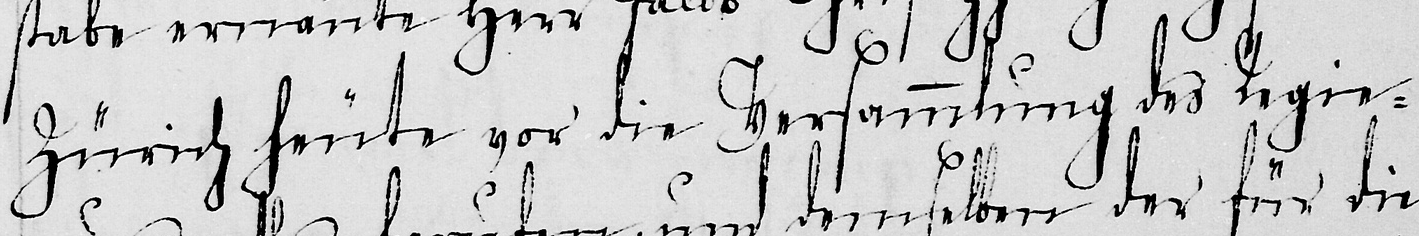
Zürich heute vor die Versammlung des Regie¬
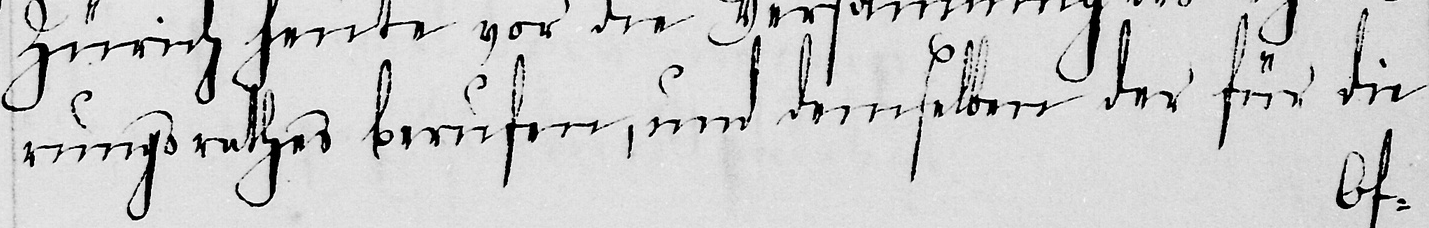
rungsrathes berufen, und demselben der für die
